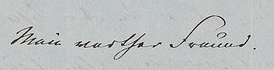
Mein werther Freund.
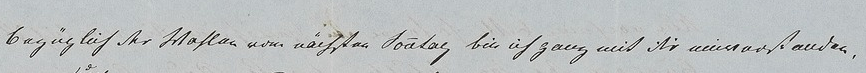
Bezüglich der Wahlen vom nächsten Sonntag bin ich ganz mit Dir einverstanden,
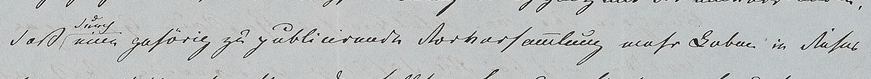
daß durch eine gehörig zu publicirende Vorversammlung mehr Leben in dieses
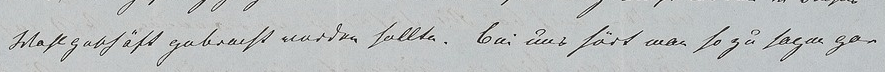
Wahlgeschäft gebracht werden sollte. Bei uns hört man sozusagen gar
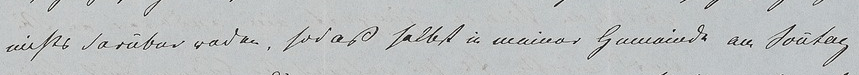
nichts darüber reden, sodaß selbst in meiner Gemeinde am Sonntag
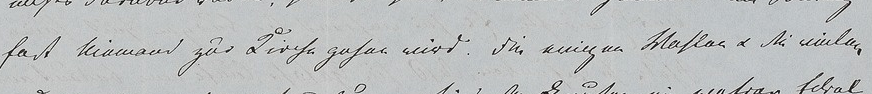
fast Niemand zur Kirche gehen wird. Die ewigen Wahlen & die vielen
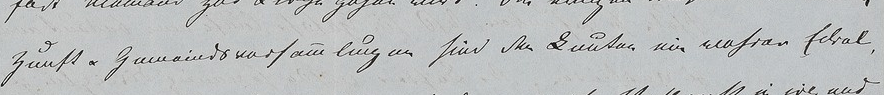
Zunft & Gemeindsversammlungen sind den Leuten ein wahrer Eckel,
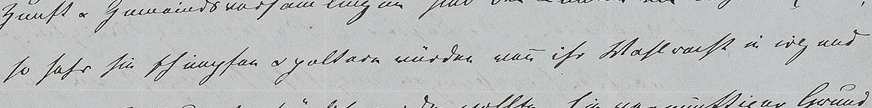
so sehr sie schimpfen & poltern würden wenn ihr Wahlrecht in irgend
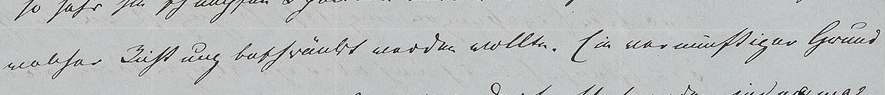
welcher Richtung beschränkt werden wollte. Ein vernünftiger Grund
